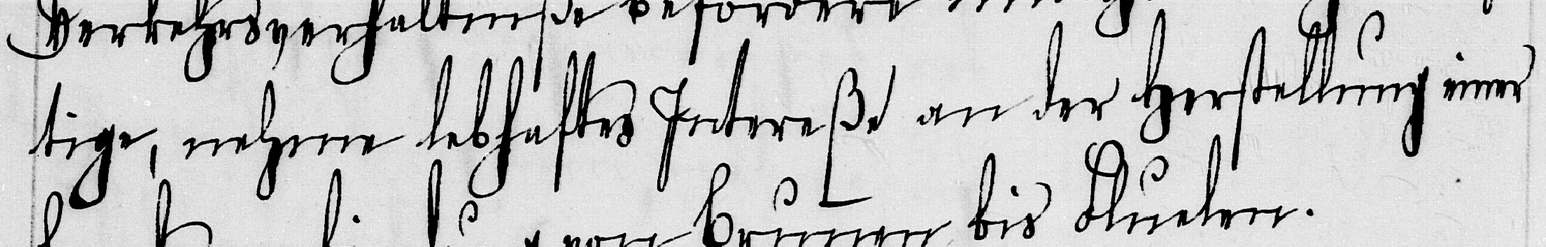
itige, nehme lebhaftes Intereße an der Herstellung einer
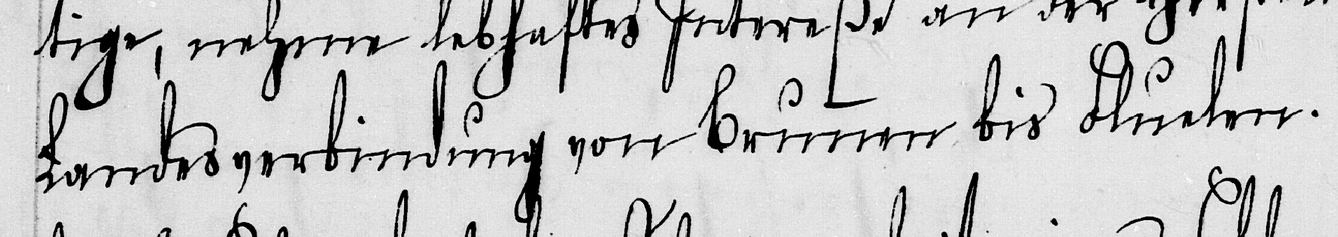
Landesverbindung von Brunnen bis Fluelen.
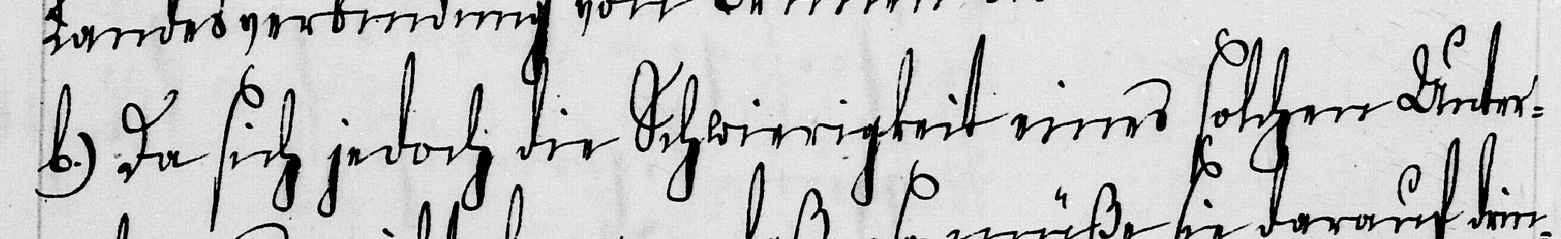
b.) Da sich jedoch die Schwierigkeit eines solchen Unter¬
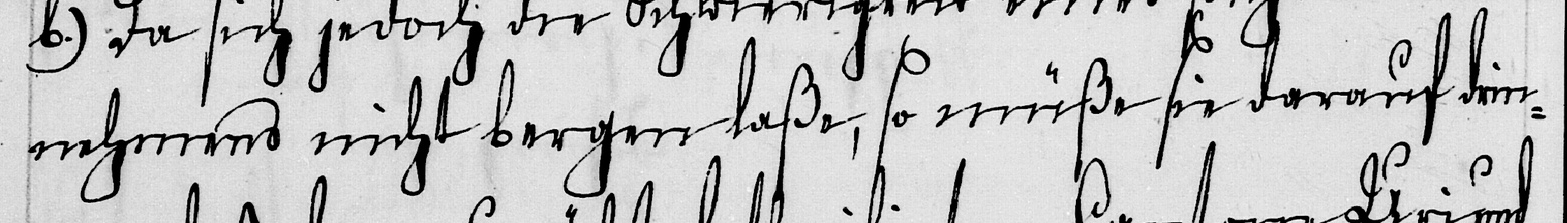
nehmens nicht bergen laße, so müße sie darauf drin¬
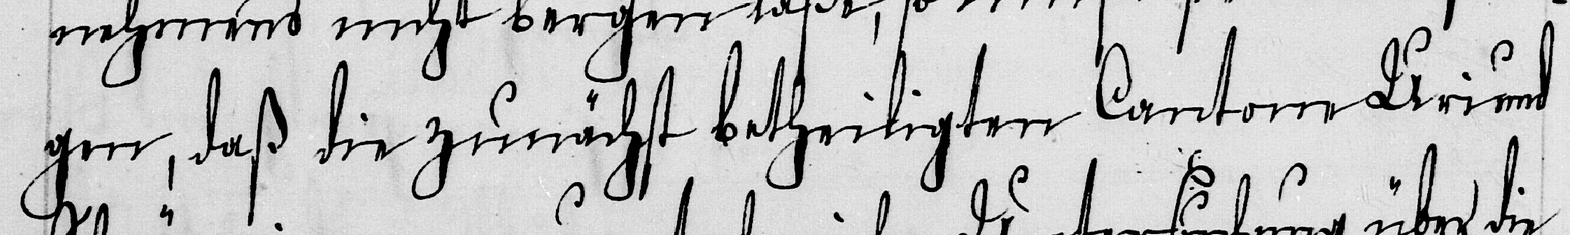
gen, daß die zunächst betheiligten Cantone Uri und
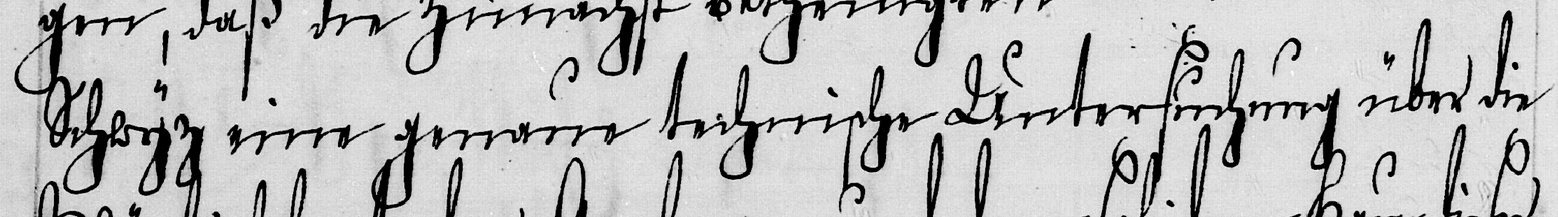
Schwyz eine genaue technische Untersuchung über die
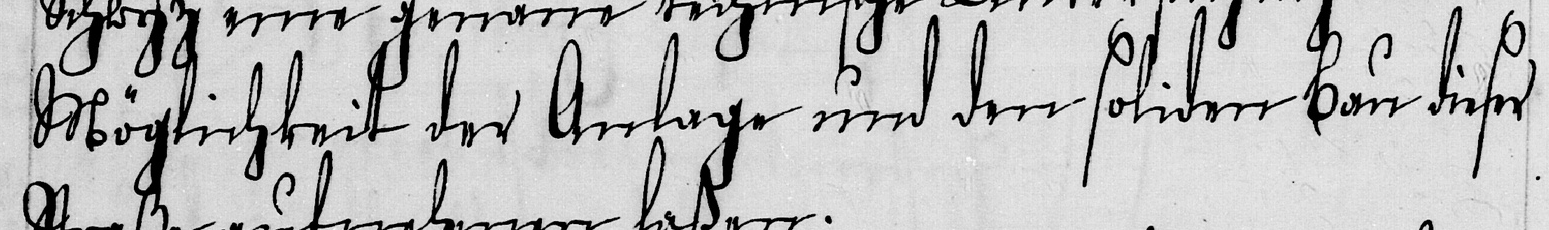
Möglichkeit der Anlage und den soliden Bau dieser
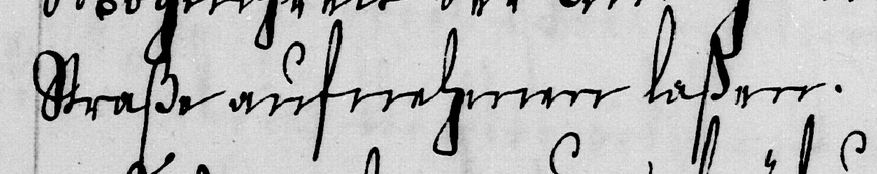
Straße aufnehmen laßen.
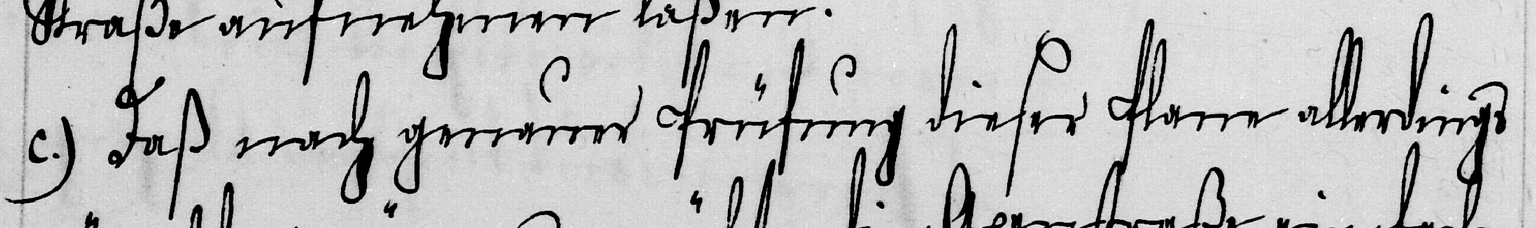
c.) Daß nach genauer Prüfung dieser Plane allerdin¬
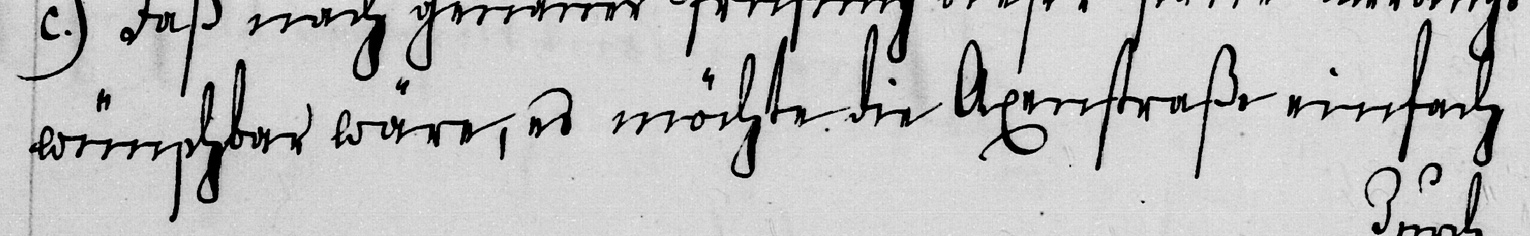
wünschbar wäre, es möchte die Axenstraße einfach
